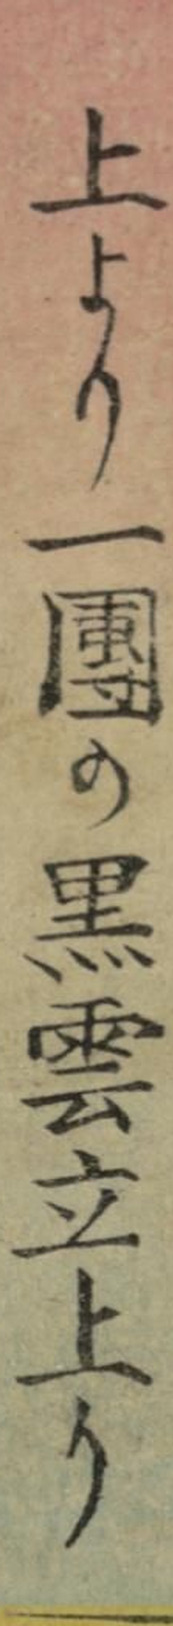上より一団の黒雲立上り
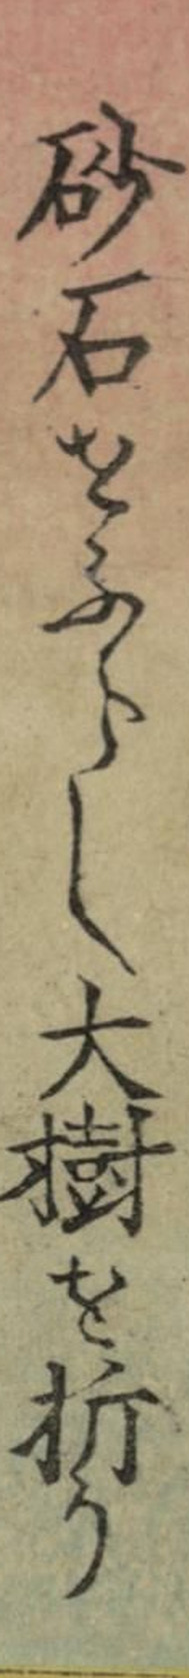砂石をふらし大樹を折り
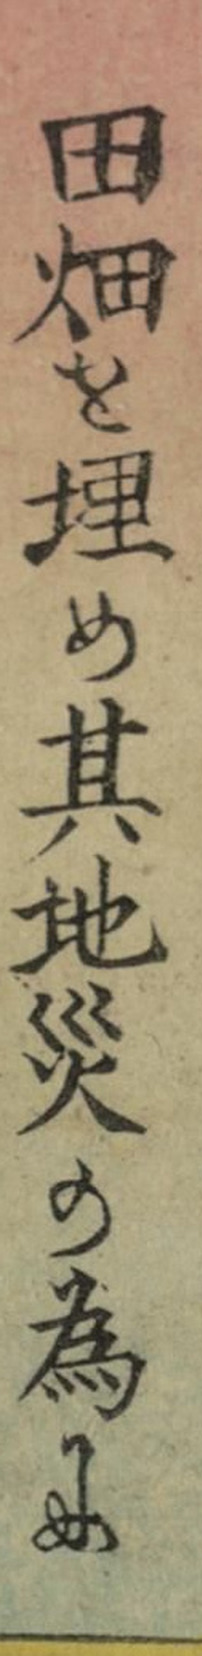田畑を埋め其地災の為に
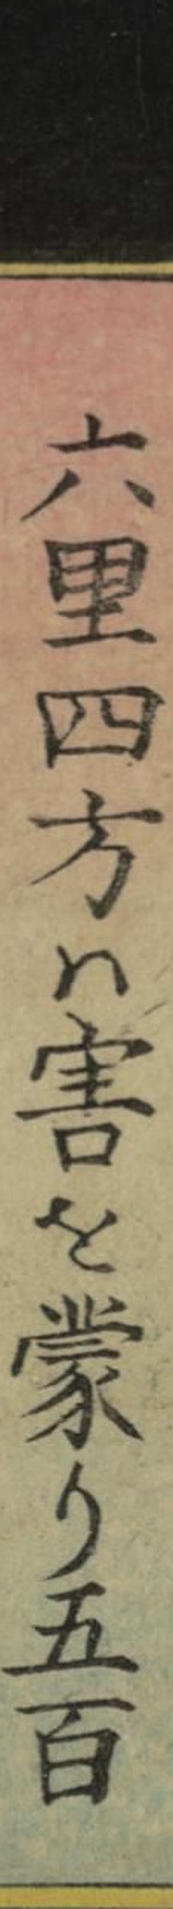六里四方は害を蒙り五百
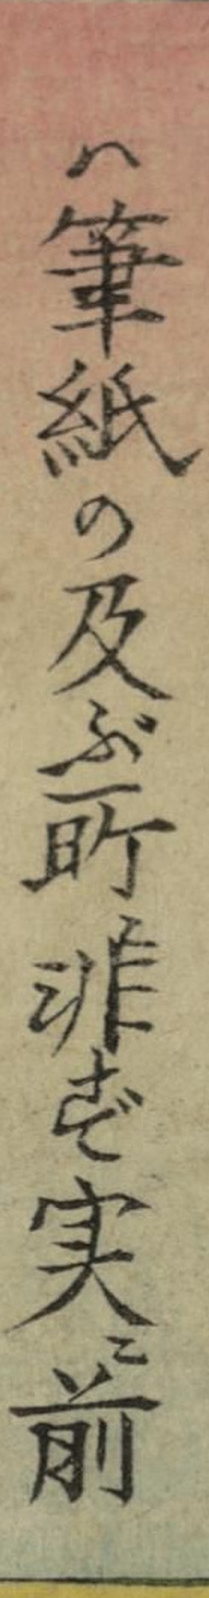は筆紙の及ぶ所に非ず実に前
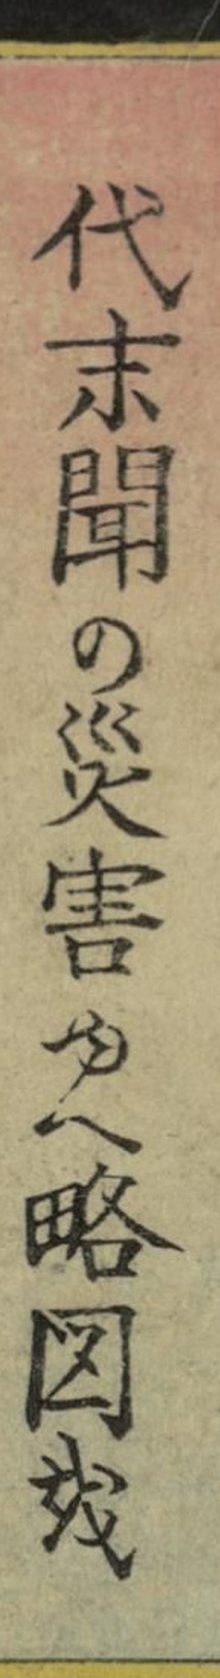代未聞の災害ゆへ略図を
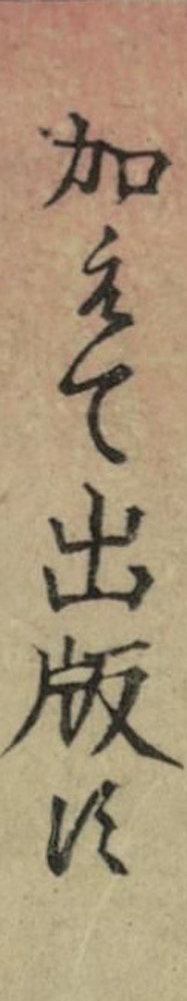加えて出版す
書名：盤梯山噴火之圖
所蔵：東京大学地震研究所図書室 Earthquake Research Institute Library, The University of Tokyo, JAPAN
